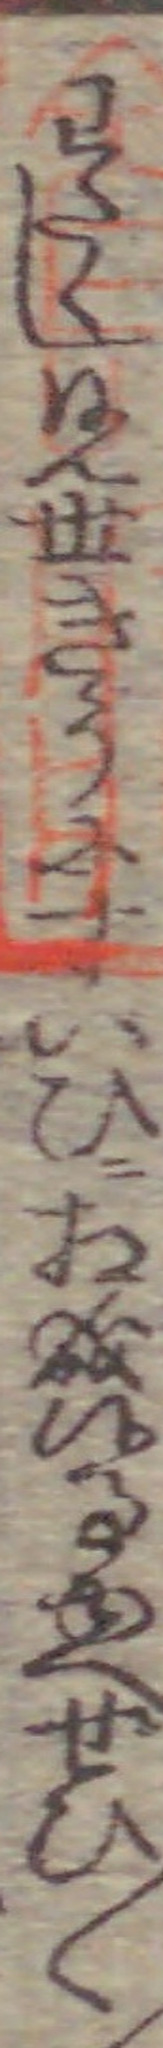わたくし見世きうにすいに相成候事ゆへぜひ〳〵
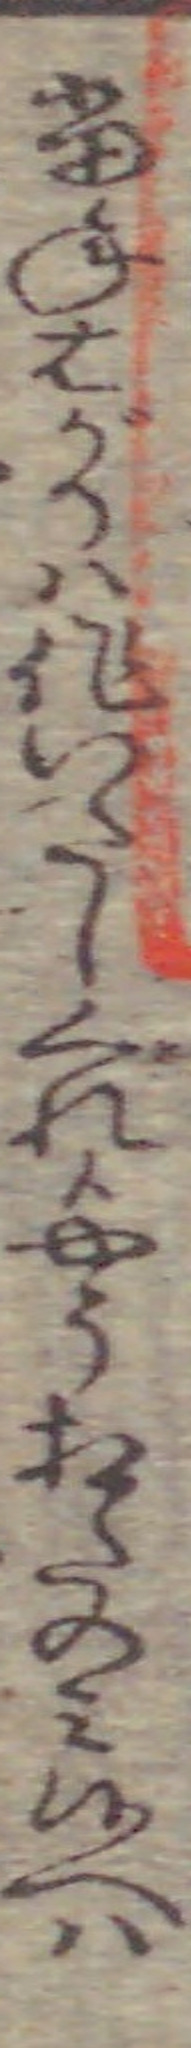当年ばかりは作いたしくれとやう相たのい候へは
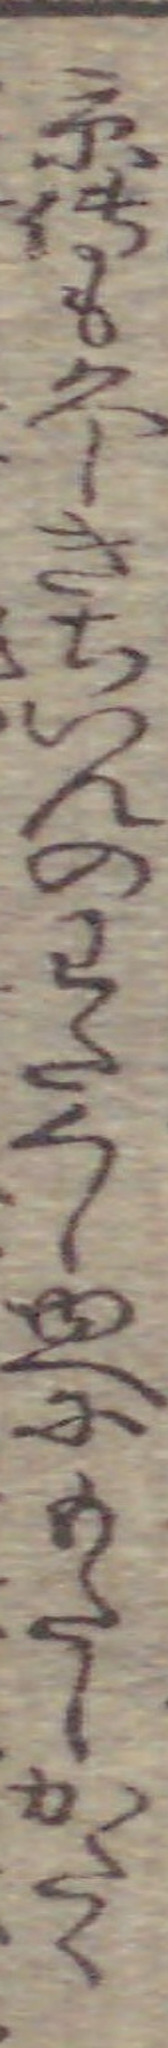京伝も久しきちいんのわたくしゆへにもたしかたく
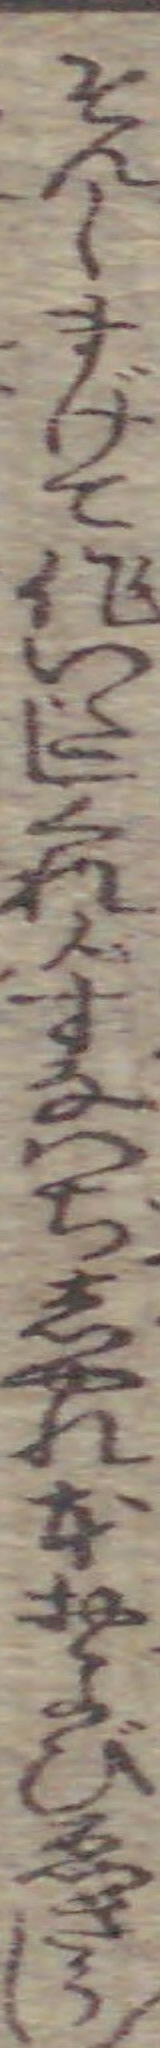そんしまげて作いたしくれとすなはちしやれ本およびゑざうし
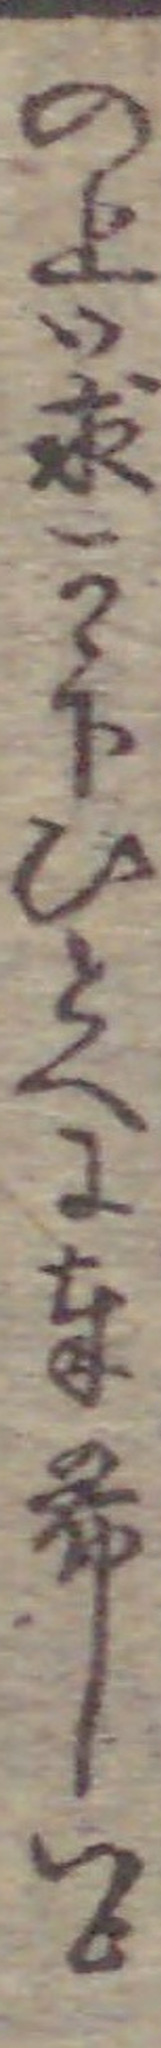の上御求可下ひとへに奉希候以上
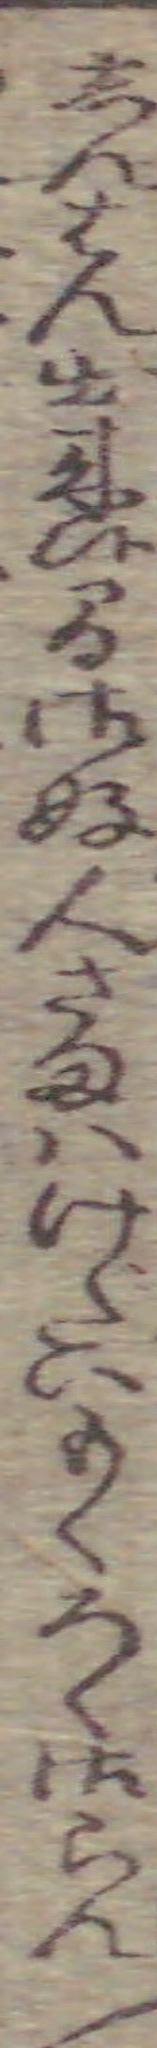しんはん出来候間御好人さまはけだいもくろく御らん

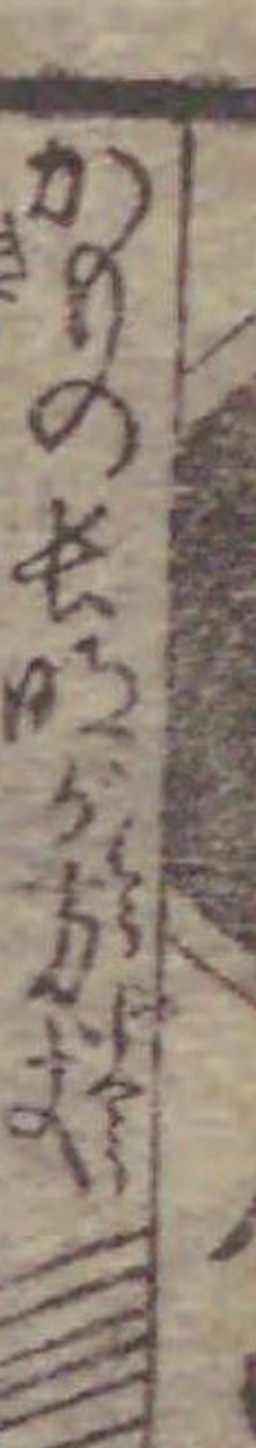かもの長明が方丈
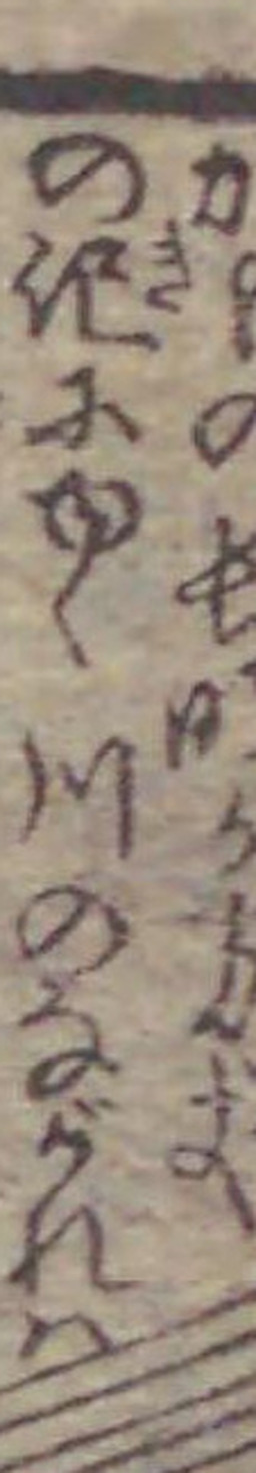の記にゆく川のながれは
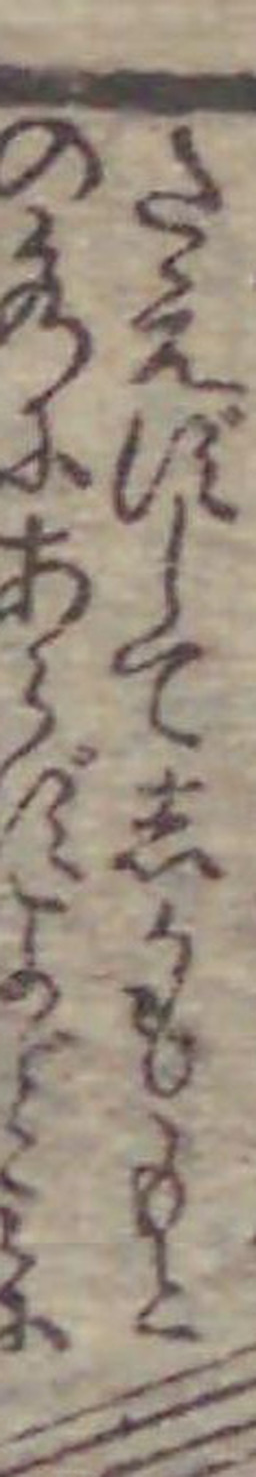の水にあらずよどみに
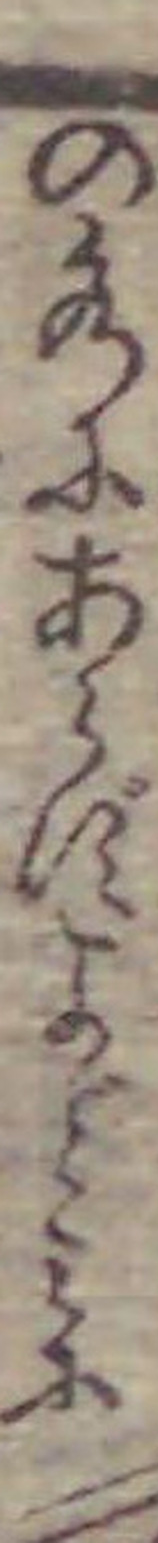の水にあらずよどみに
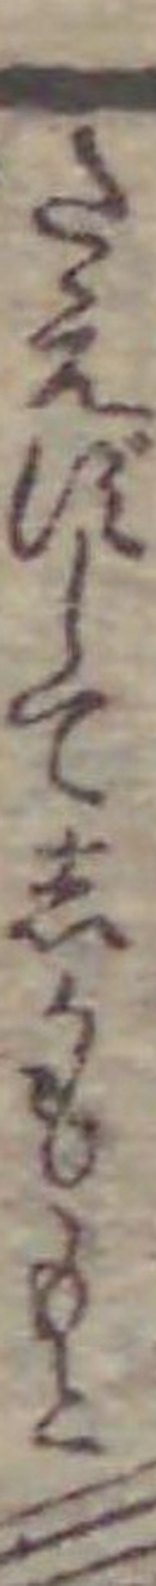たえずしてしかももと
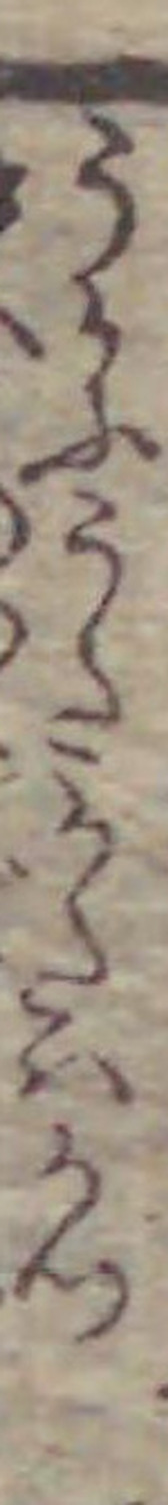うかふうたかたはかつ
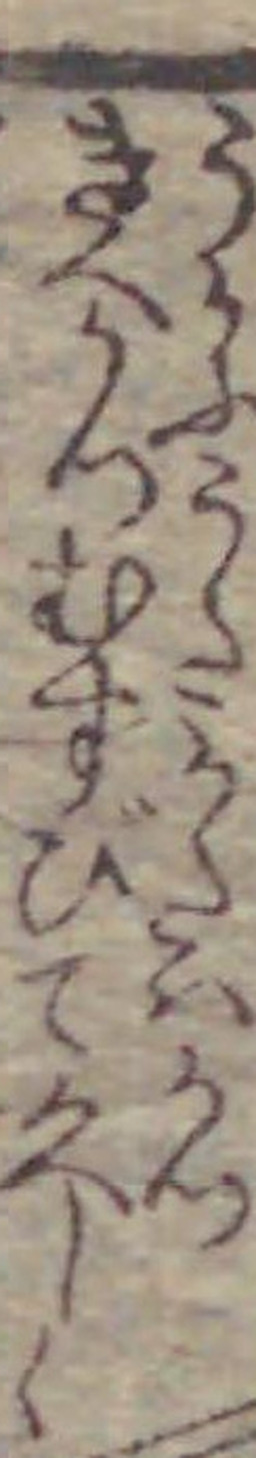きへかつむすびて久しく
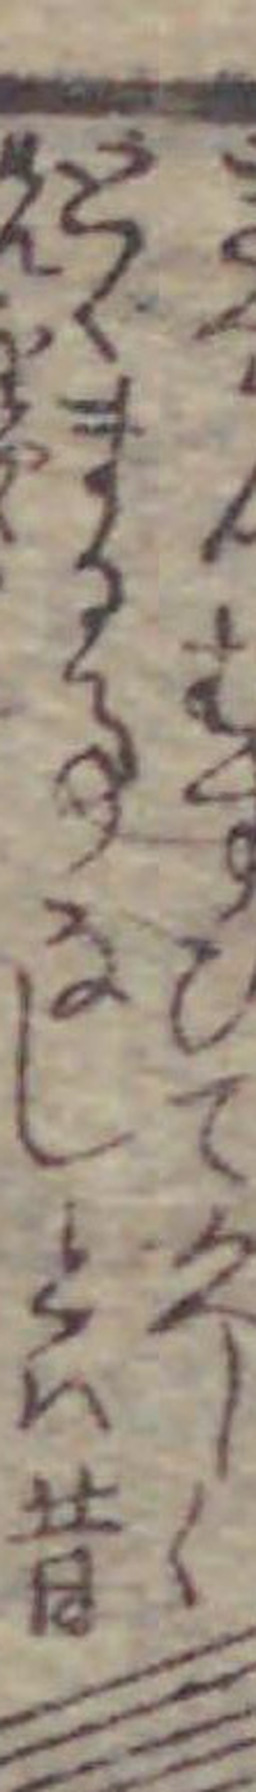とゞまる事なしとは昔
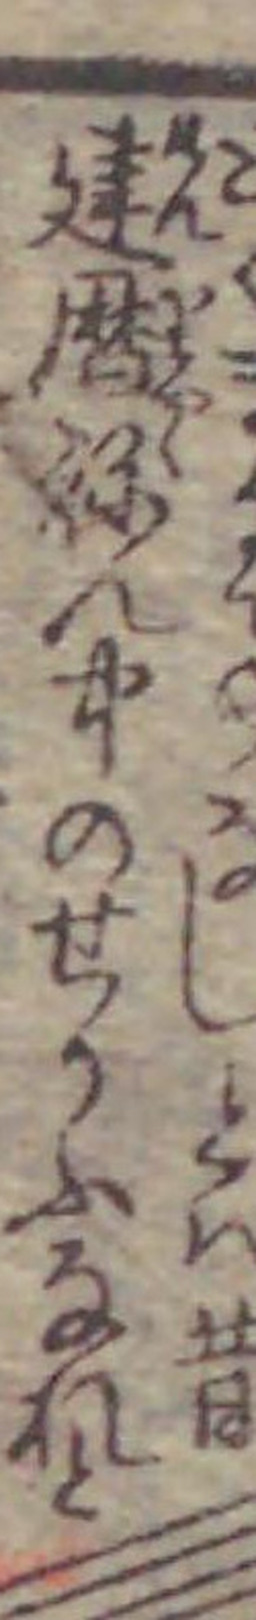建暦ねん中のせりふなれと
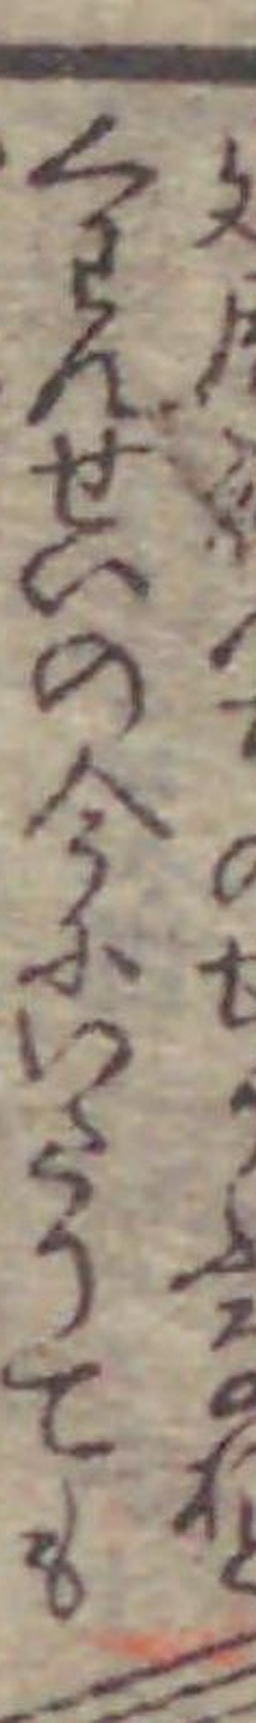くわんせいの今にいたりても
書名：箱入娘面屋人魚 3巻
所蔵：国立国会図書館 National Diet Library, JAPAN
